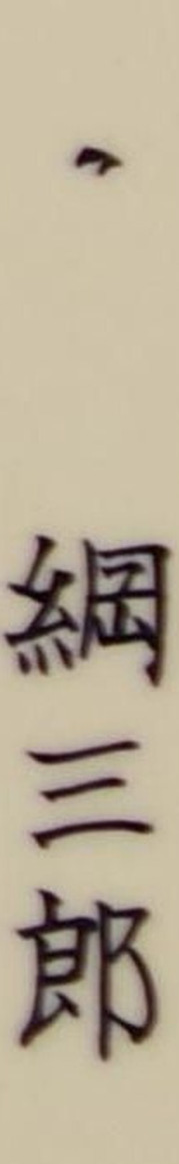綱三郎
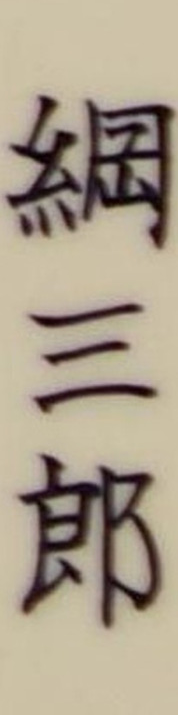綱三郎
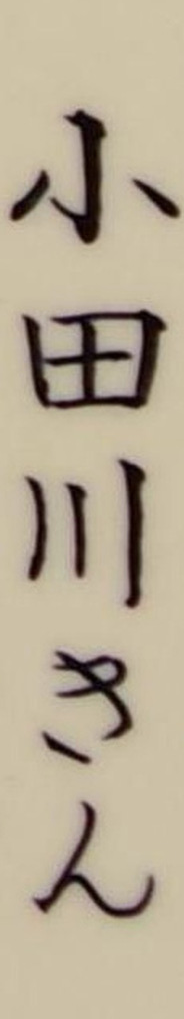小田川きん
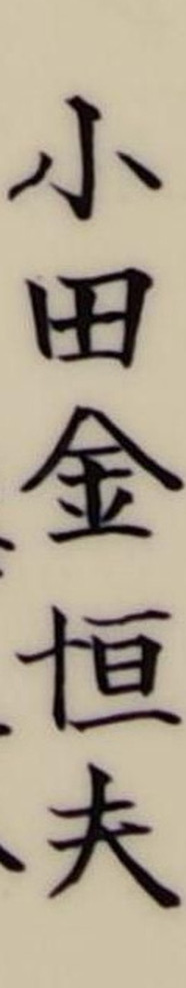小田金恒夫
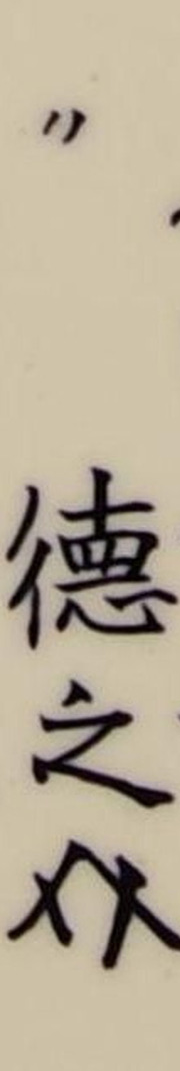徳之介
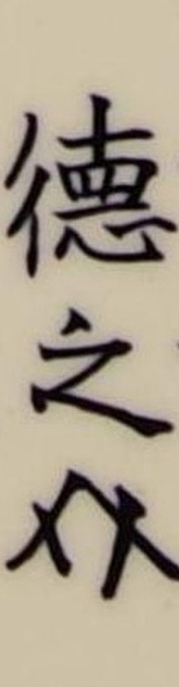徳之介
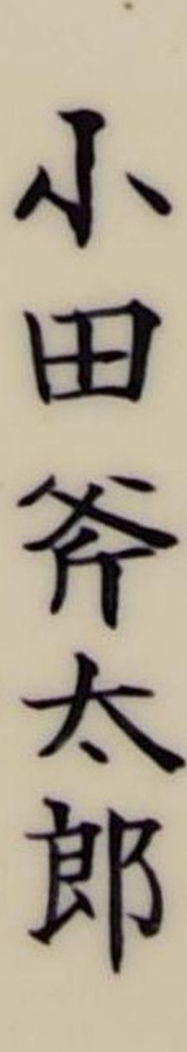小田斧太郎
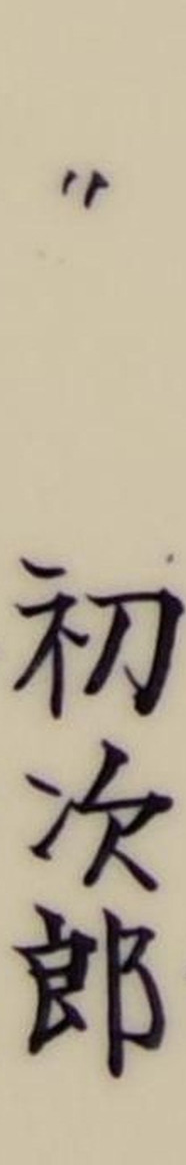初次郎
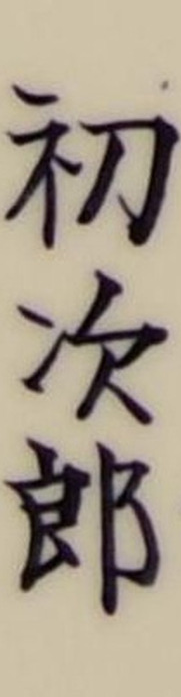初次郎
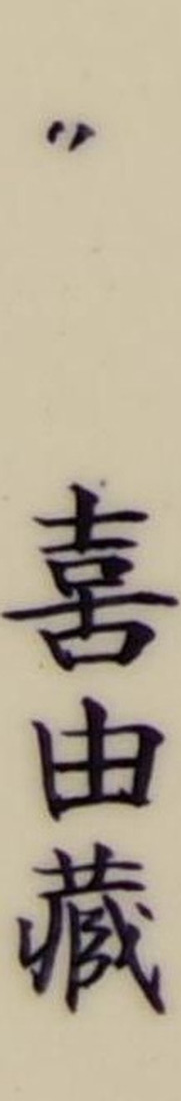喜由蔵
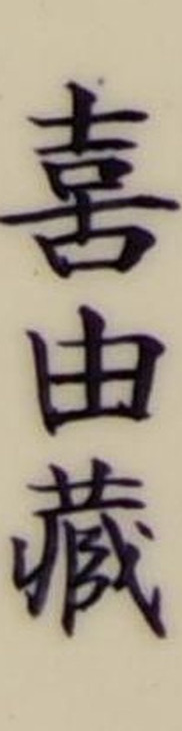喜由蔵
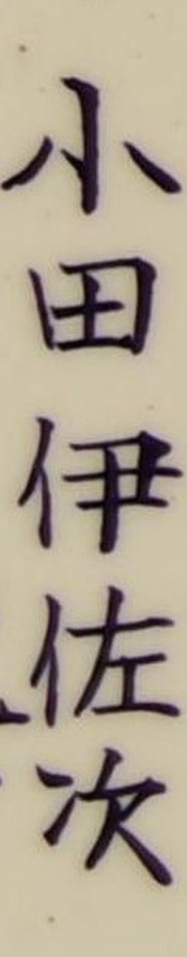小田伊佐次

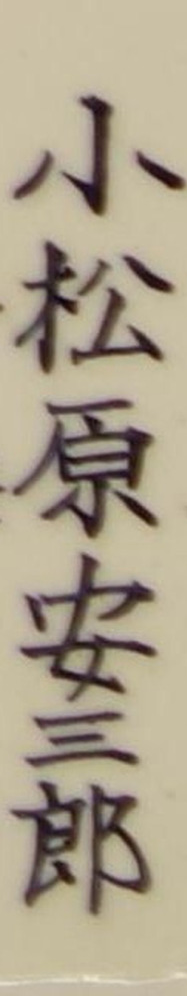小松原安三郎
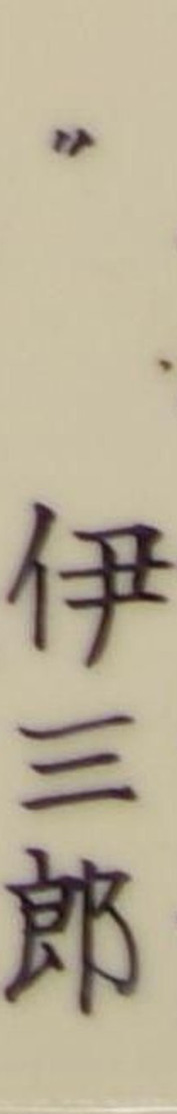伊三郎
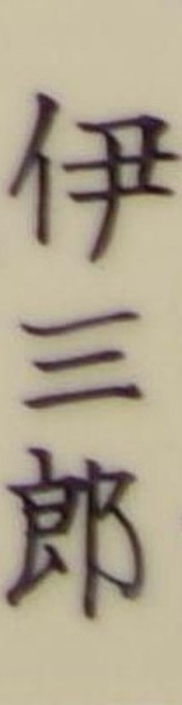伊三郎
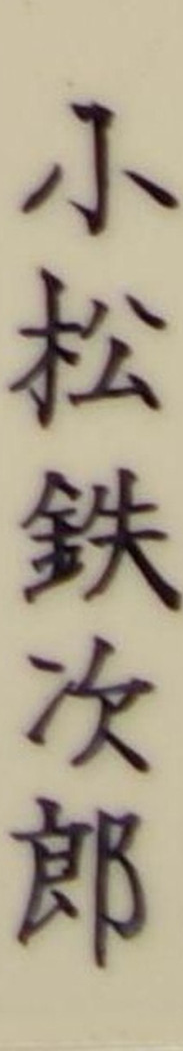小松鉄次郎
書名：E~L
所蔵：高野山金剛峯寺
